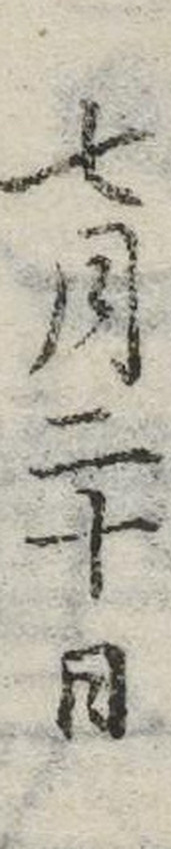七月二十日
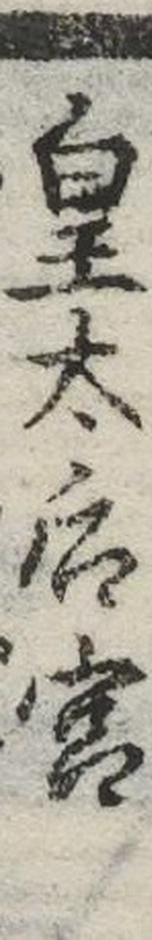皇太后宮
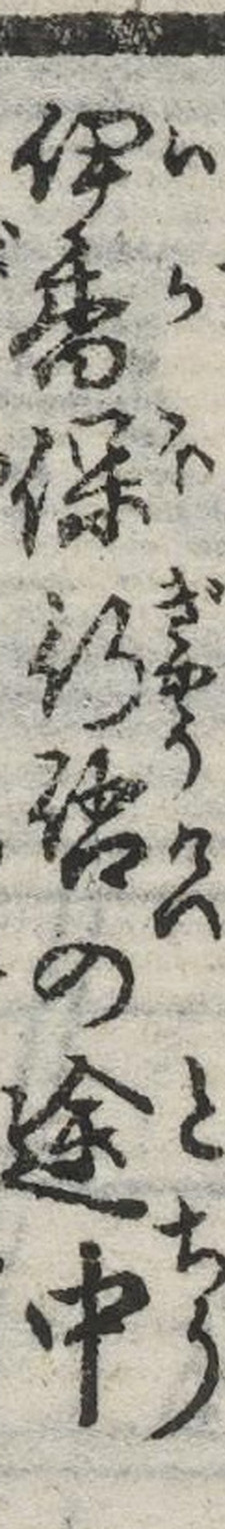伊香保行啓の途中
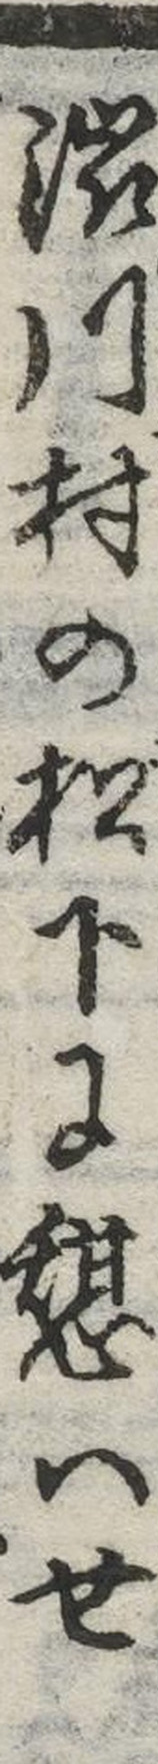渋川村の松下に憩はせ
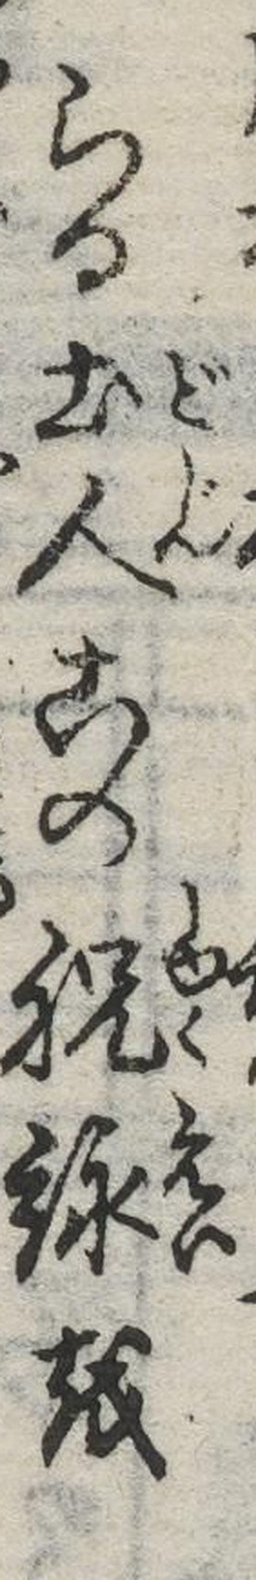らる土人この祝詠を
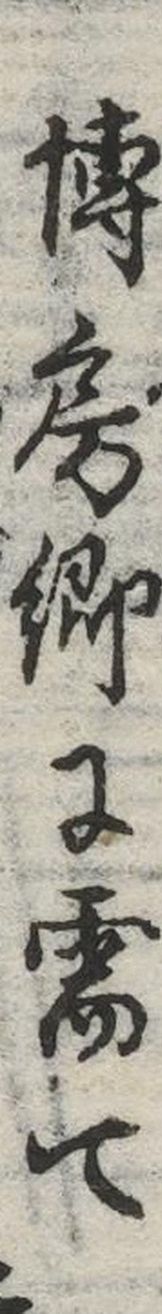博房卿に需て
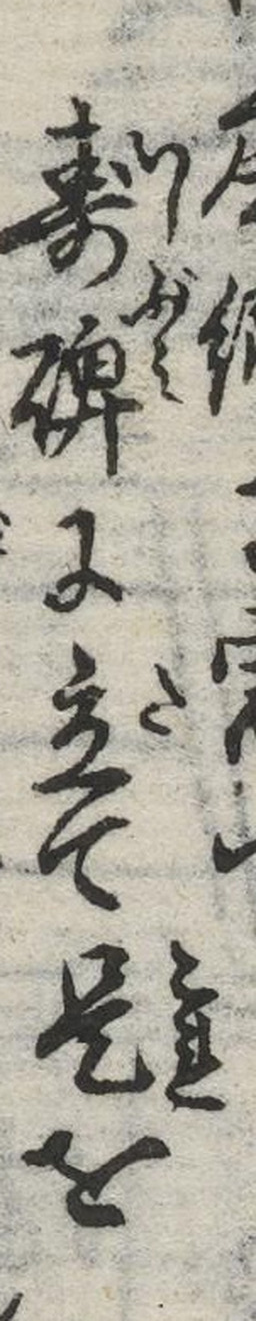寿碑に立て是を
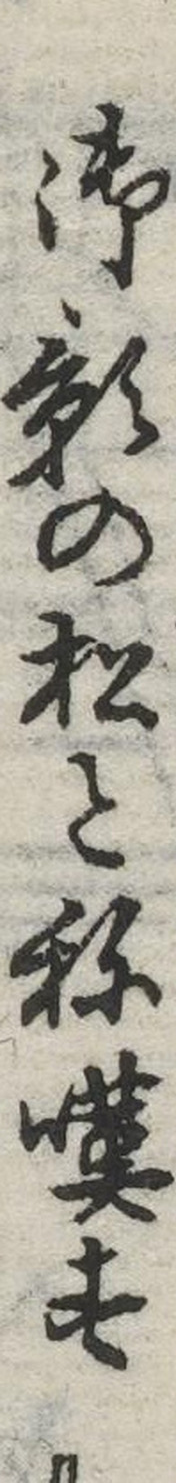御影の松と称嘆す
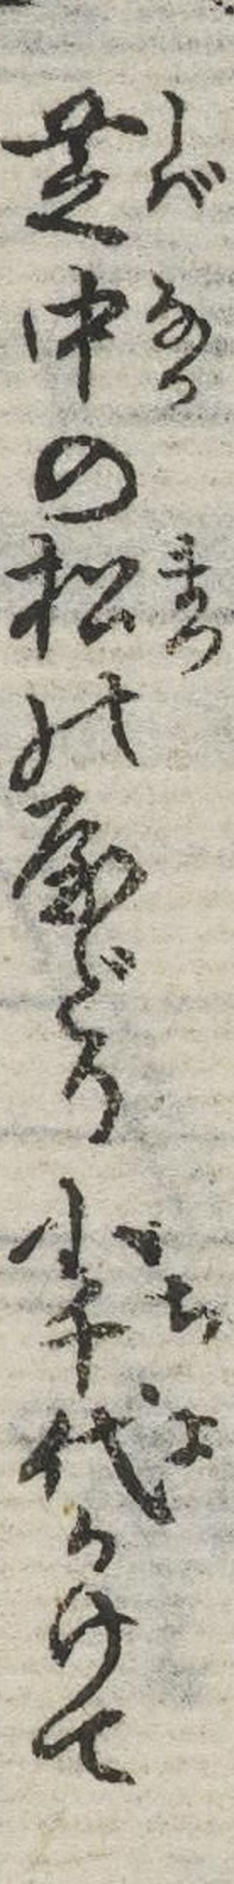芝中の松のやどりに千代かけて
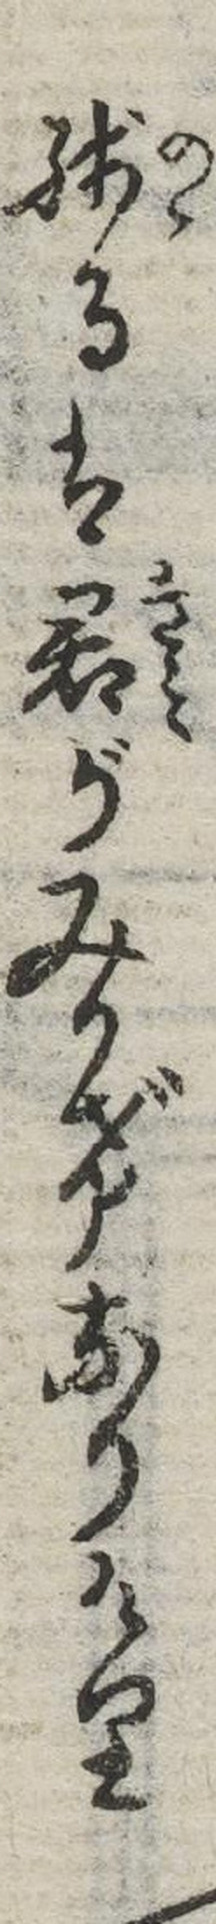残るは君がみかげなりけり
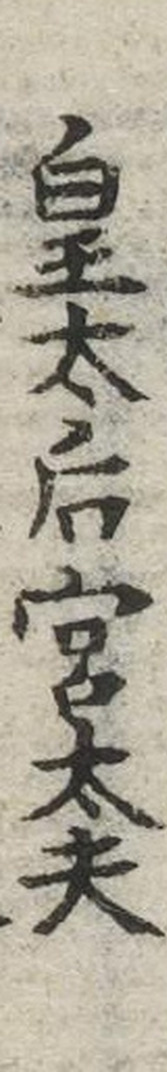皇太后宮太夫
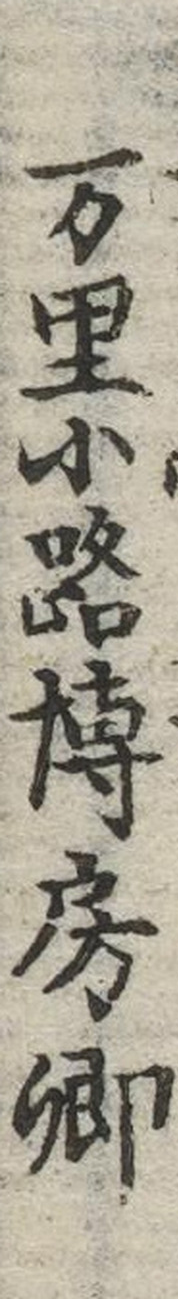万里小路博房郷

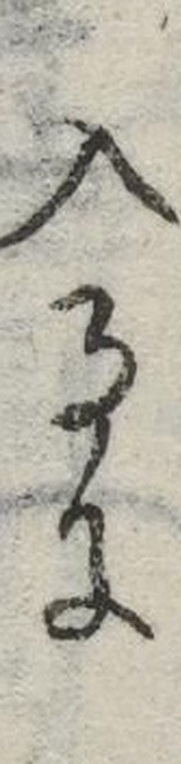入るに
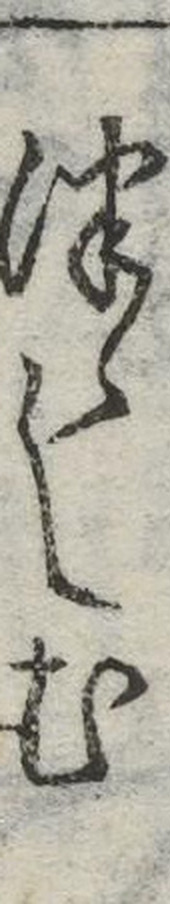つゝしむ
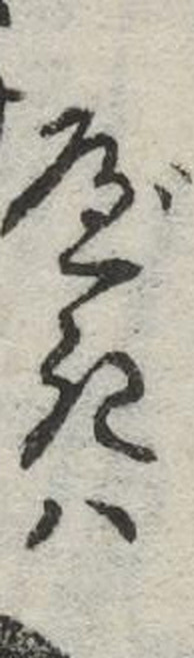べきは
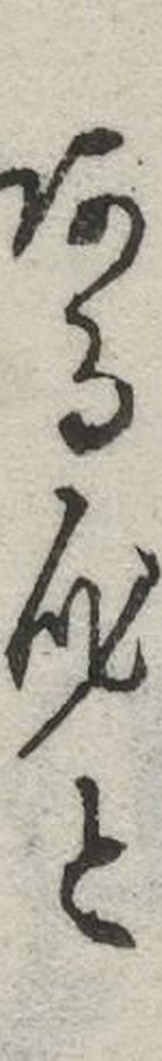あるみと
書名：諸國温泉遊覽記　全
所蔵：東京大学地震研究所図書室 Earthquake Research Institute Library, The University of Tokyo, JAPAN
